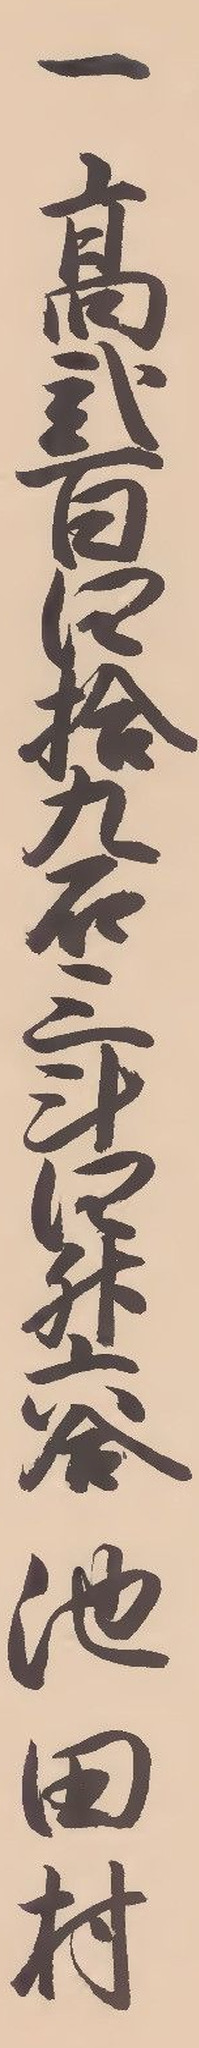一高弐百四拾九石三斗四升六合池田村
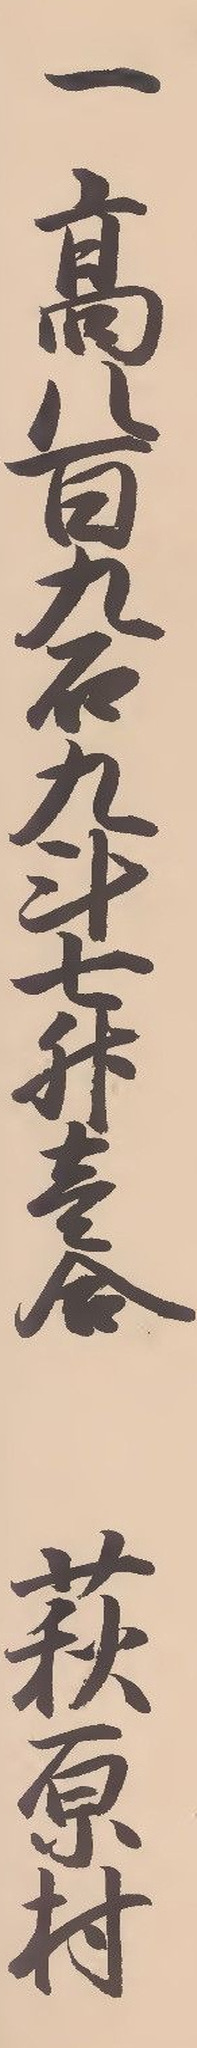一高八百九石九斗七升壱合萩原村
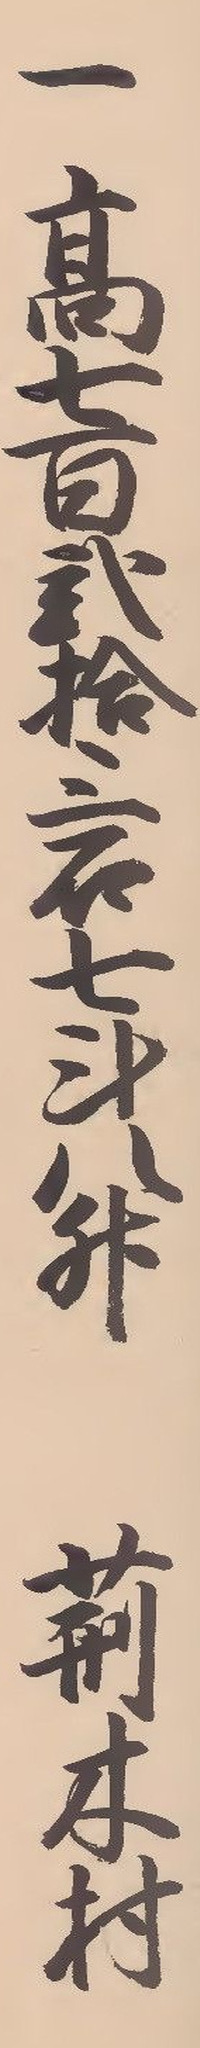一高七百弐拾三石七斗八升荊木村
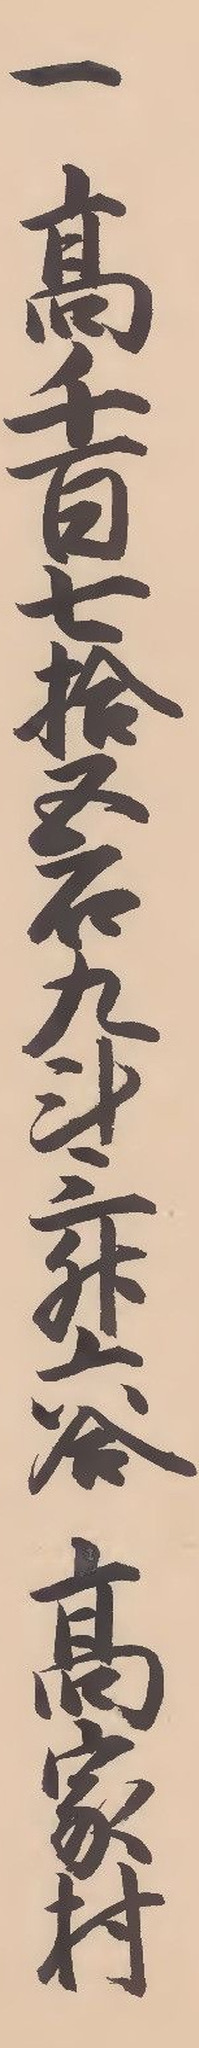一高千百七拾五石九斗三升六合高家村
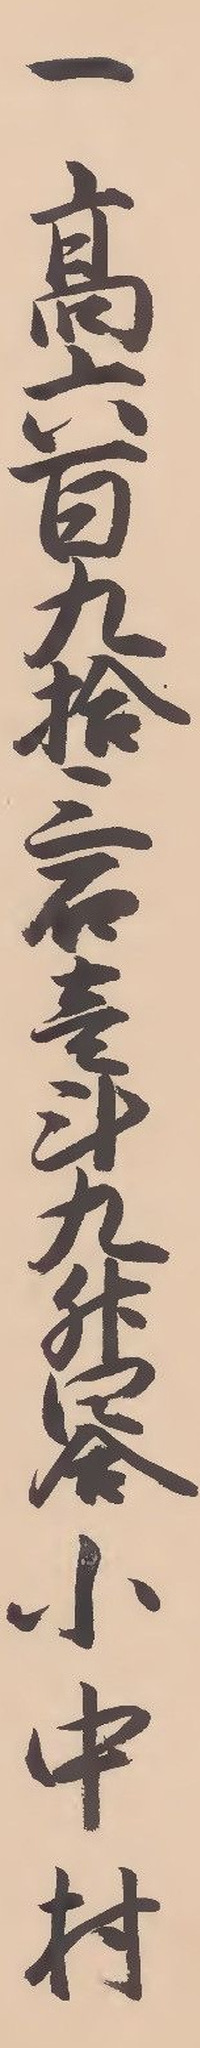一高六百九拾三石壱斗九升四合小中村
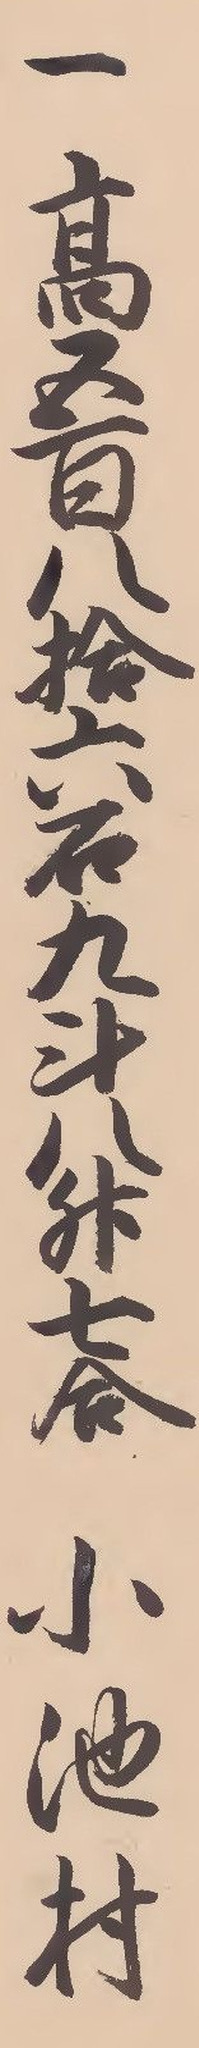一高五百八拾六石九斗八升七合小池村

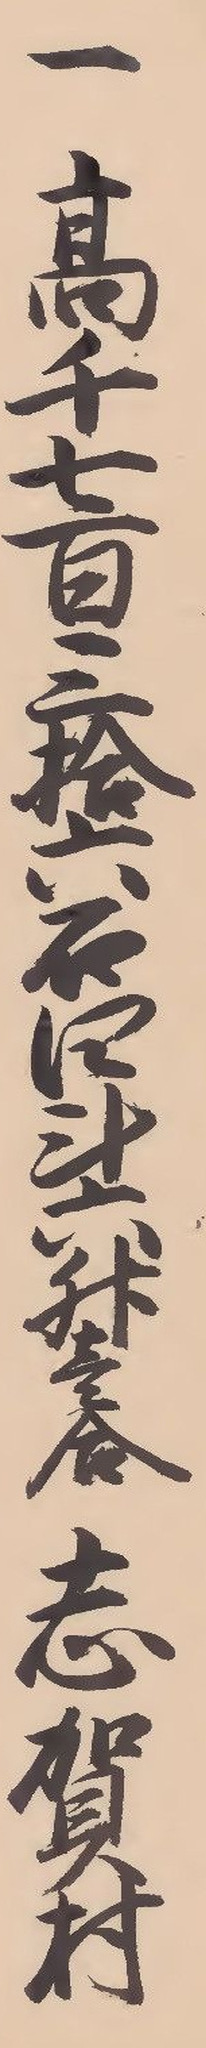一高千七百三拾六石四斗六升壱合志賀村
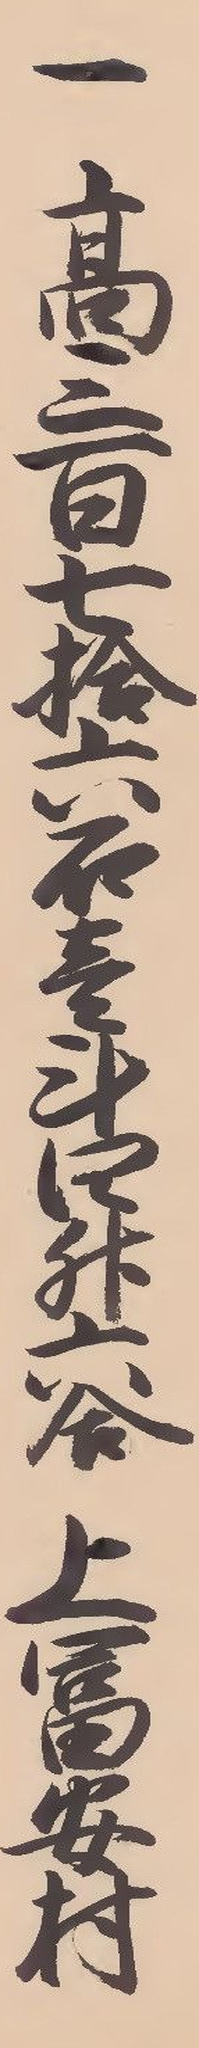一高三百七拾六石壱斗四升六合上富安村
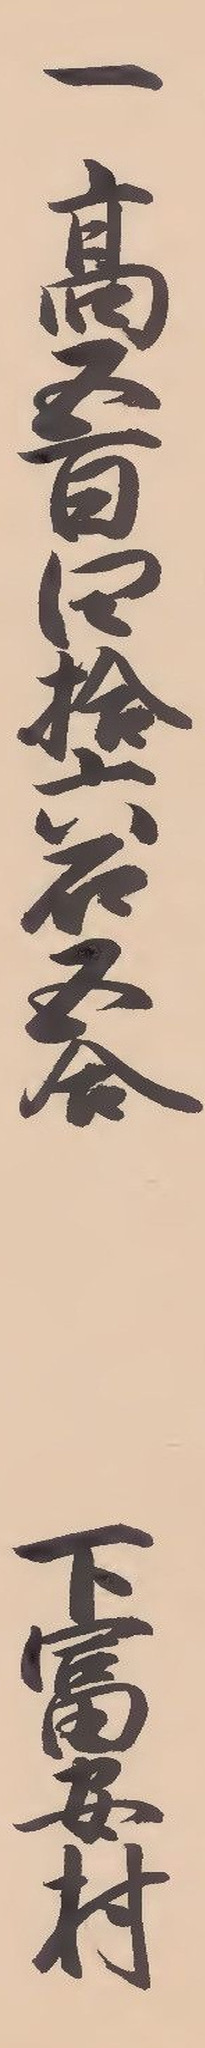一高五百四拾六石五合下富安村
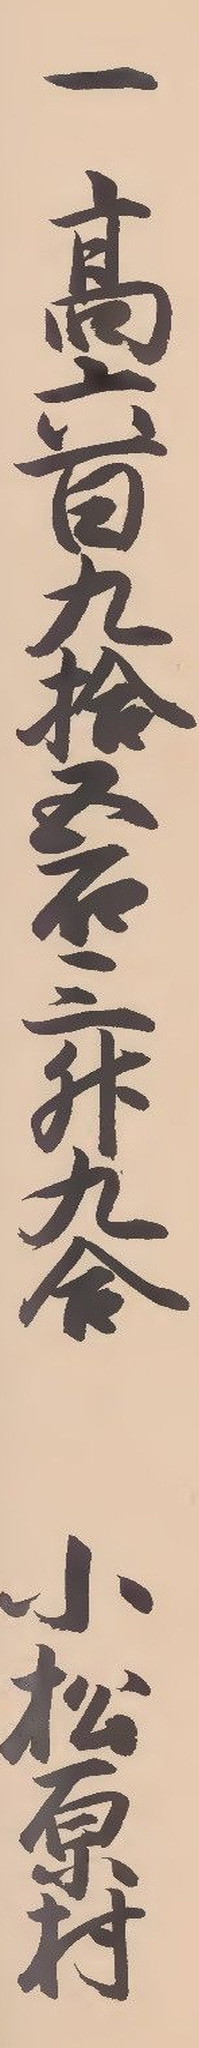一高六百九拾五石三升九合小松原村
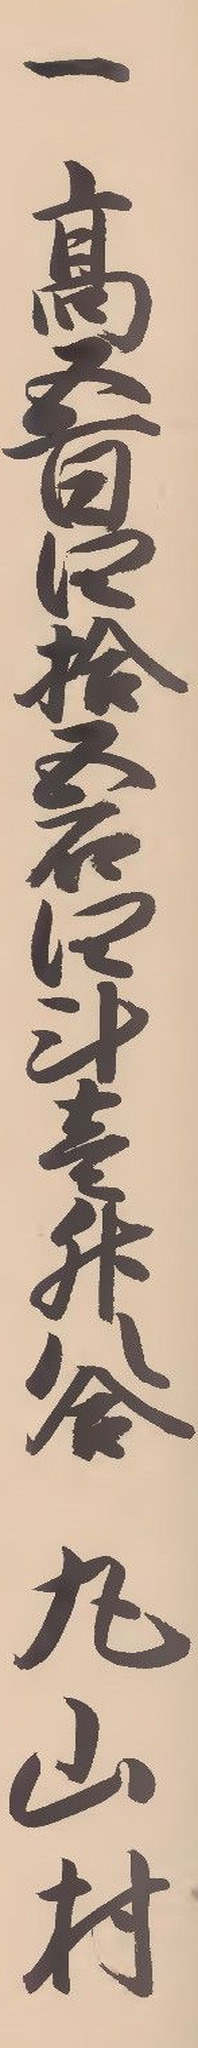一高五百四拾五石四斗壱升八合丸山村
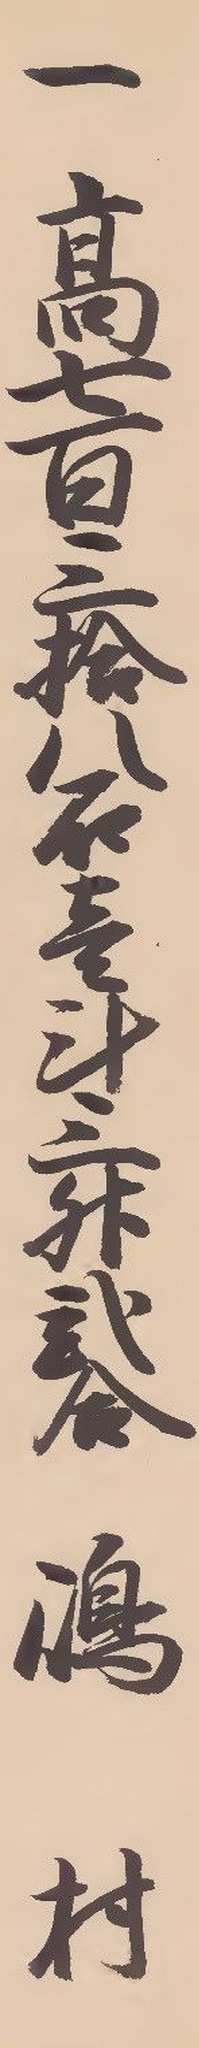一高七百三拾八石壱斗三升弐合島村
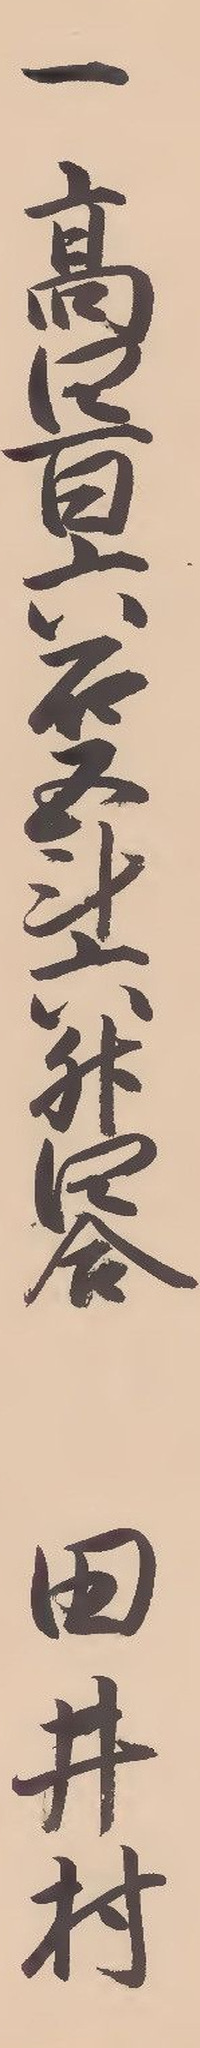一高四百六石五斗六升四合田井村

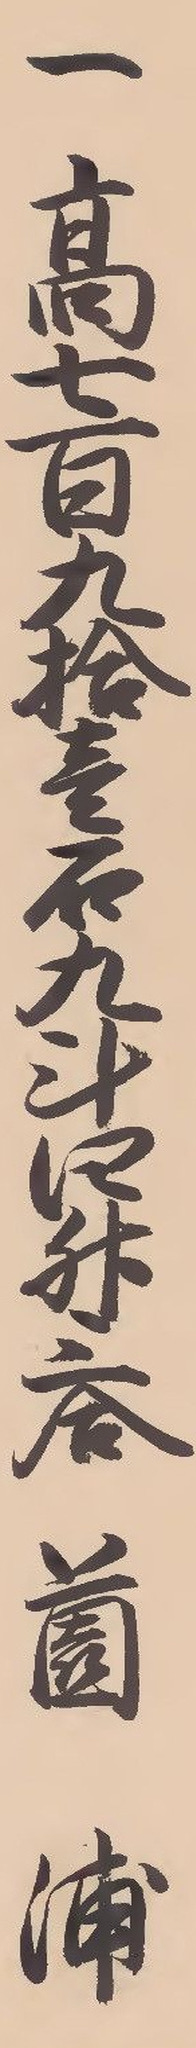一高七百九拾壱石九斗四升三合薗浦
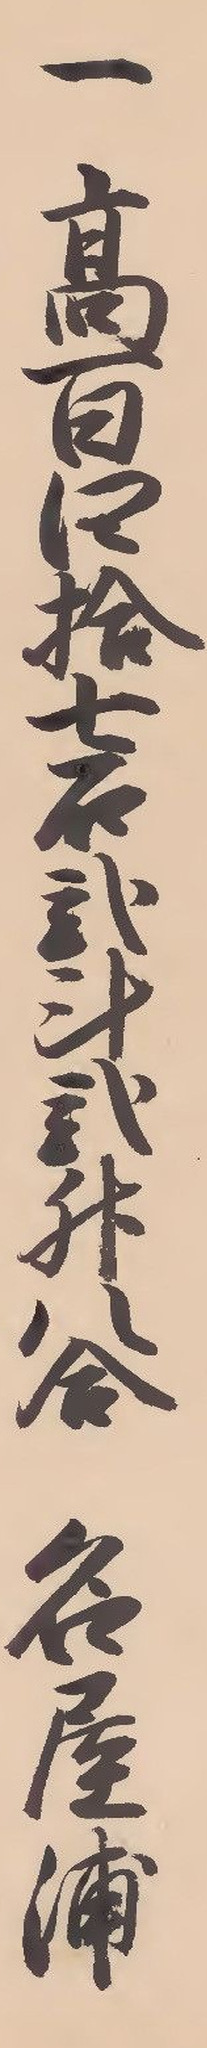一高百四拾七石弐斗弐升八合名屋浦
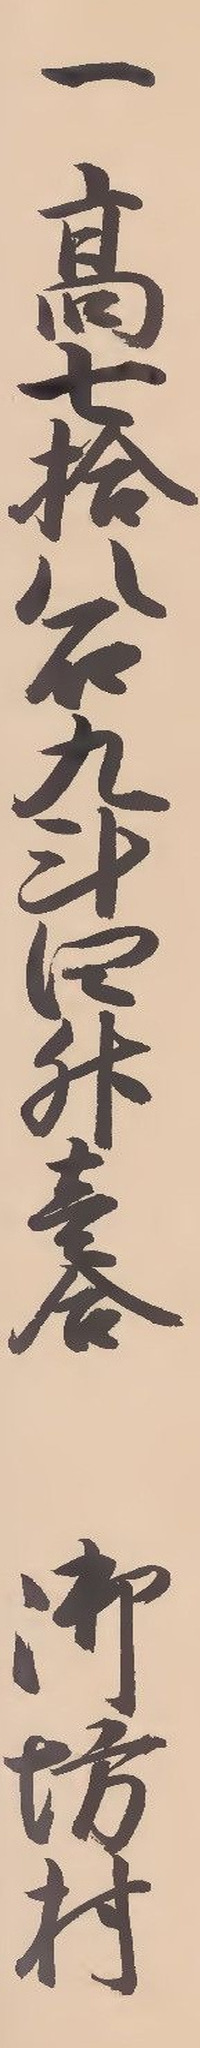一高七拾八石九斗四升壱合御坊村
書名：紀伊国郷帳
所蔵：国立公文書館 National Archives of Japan
